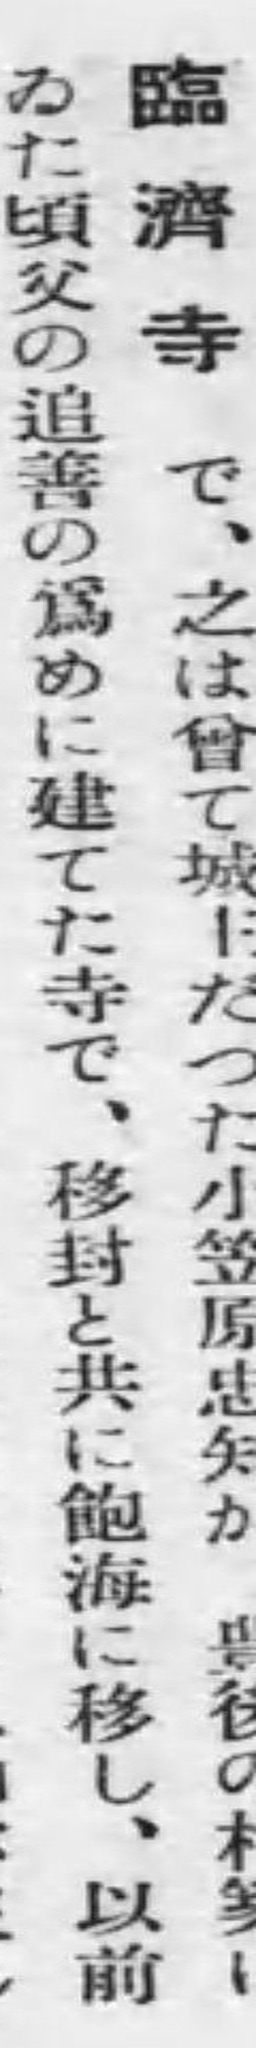ゐた頃父の追善の為めに建てた寺で、移封と共に飽海に移し、以前
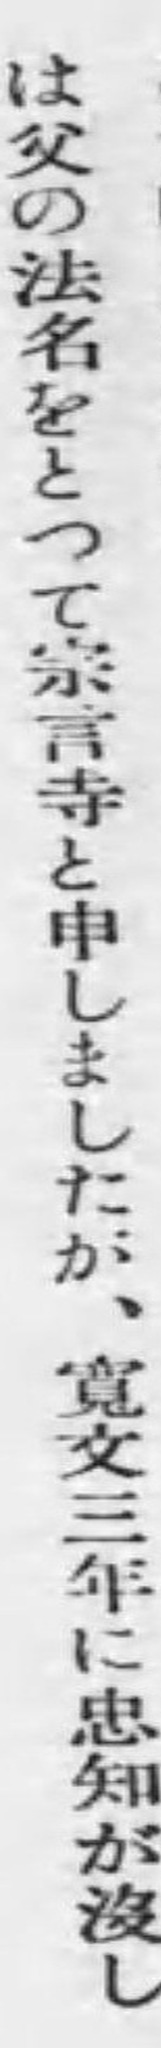は父の法名をとつて宗言寺と申しましたが、寛文三年に忠知が没し
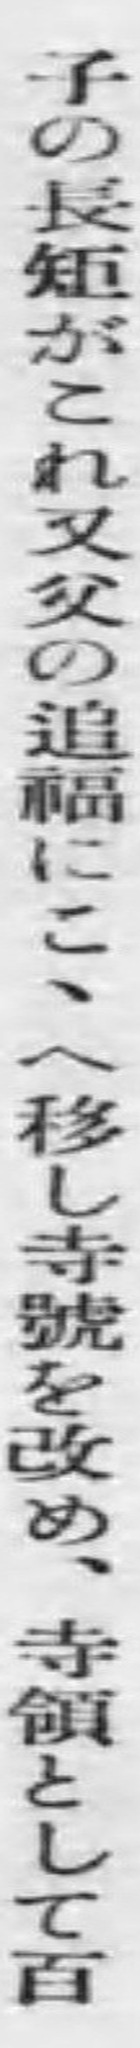子の長矩がこれ又父の追福にこゝへ移し寺号を改め、寺領として百
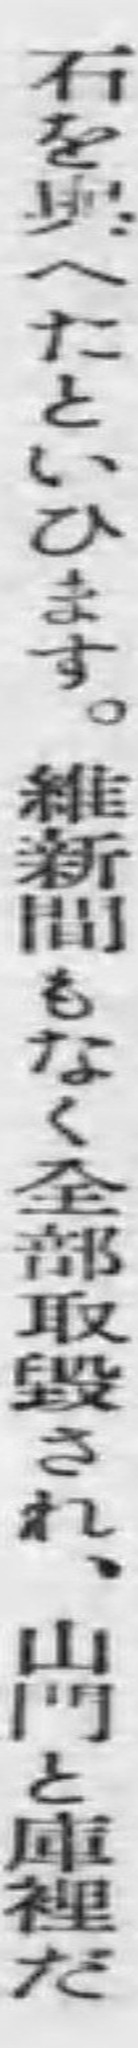石を与へたといひます。維新間もなく全部取毀され、山門と庫裡だ
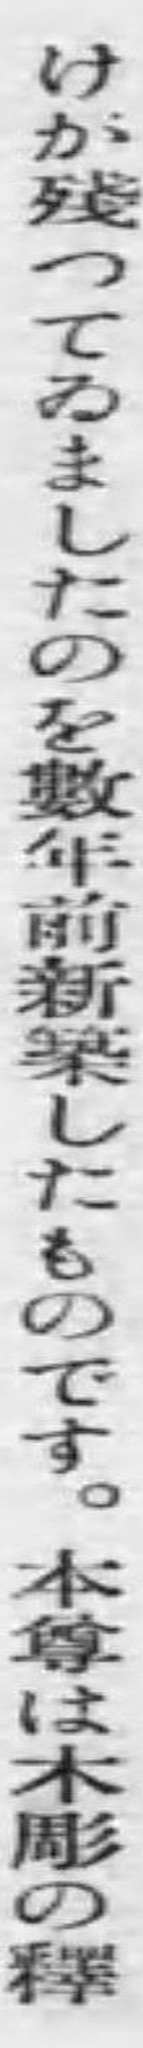けが残つてゐましたのを数年前新築したものです。本尊は木彫の釈
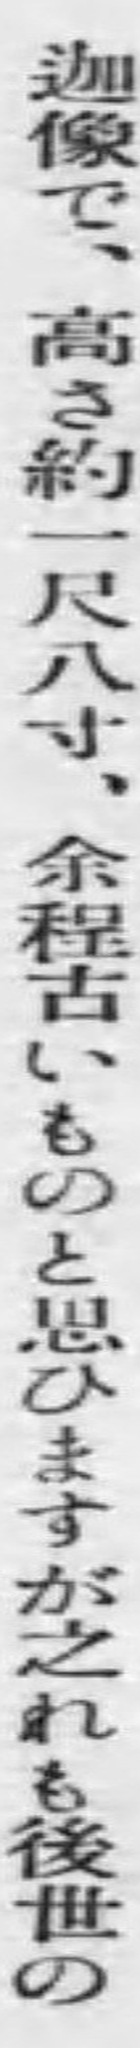迦像で、高さ約一尺八寸、余程古いものと思ひますが之れも後世の
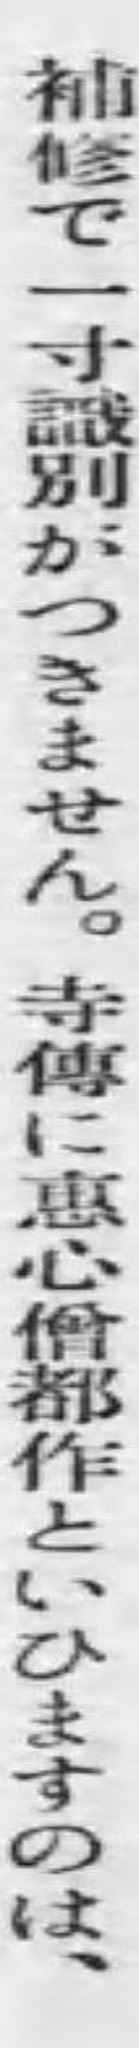補修で一寸識別がつきません。寺伝に恵心僧都作といひますのは、
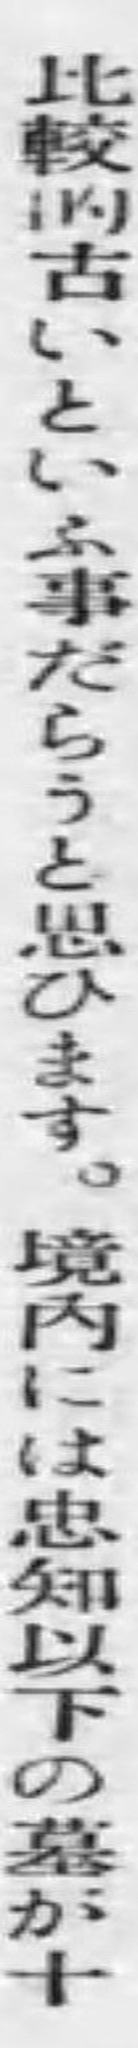比較的古いといふ事だらうと思ひます。境内には忠知以下の墓が十
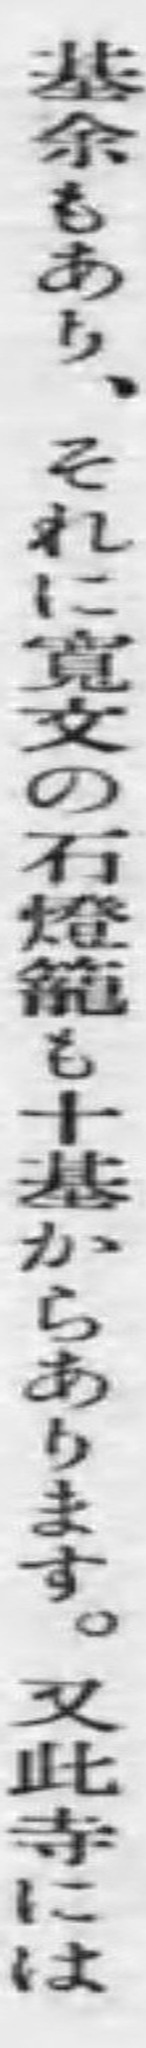基余もあり、それに寛文の石灯籠も十基からあります。又此寺には
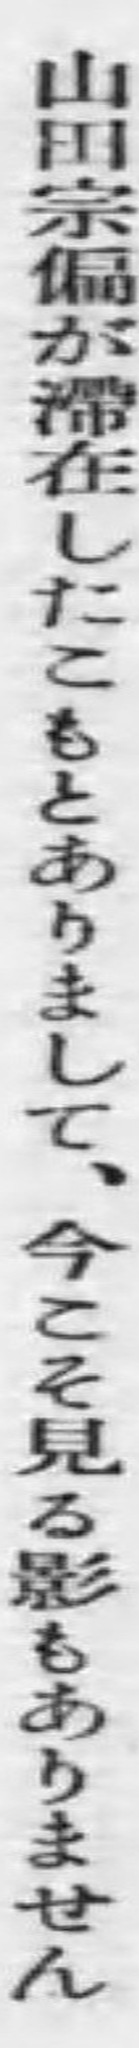山田宗偏が滞在したこもとありまして、今こそ見る影もありません
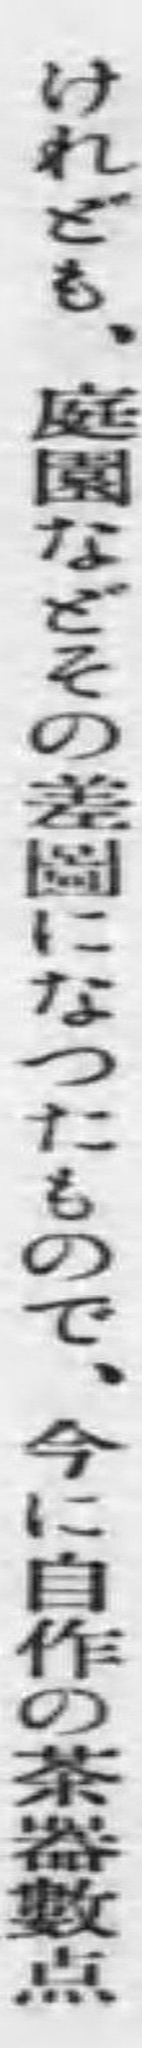けれども、庭園などその差図になつたもので、今に自作の茶器数点
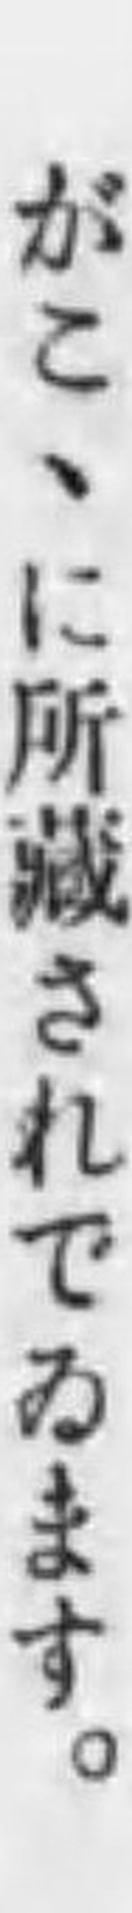がこゝに所蔵されでゐます。
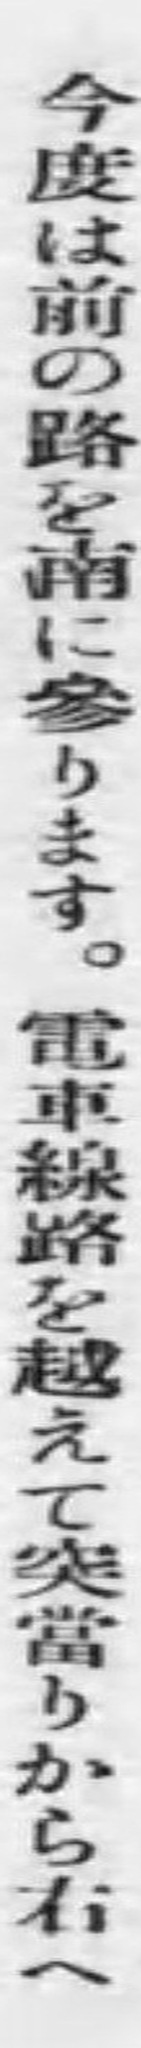今度は前の路を南に参ります。電車線路を越えて突当りから右へ
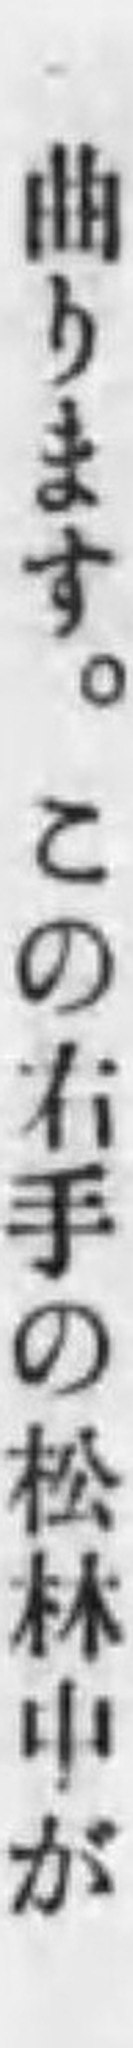曲ります。この右手の松林中が

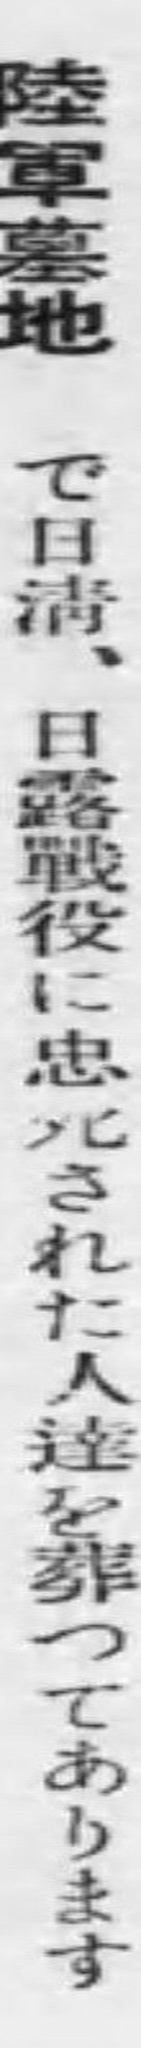陸軍墓地で日清、日露戦役に忠死された人達を葬つてあります
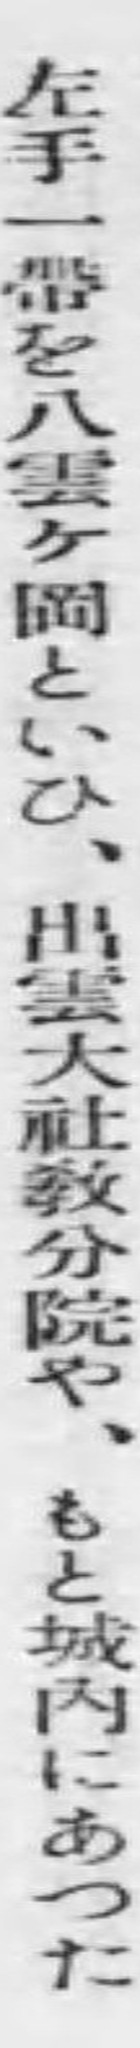左手一帯を八雲ヶ岡といひ、出雲大社教分院や、もと城内にあつた
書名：東三河道中記 : 豊橋市及其附近案内
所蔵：国立国会図書館 National Diet Library, JAPAN
